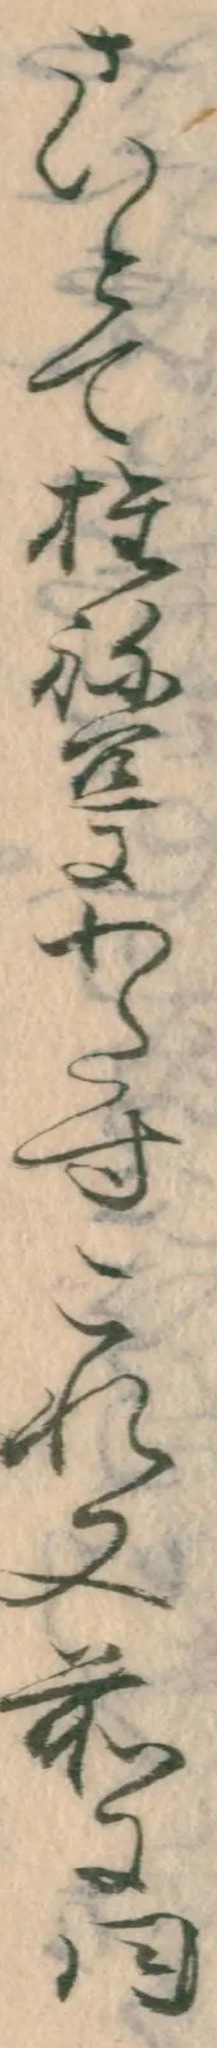まいとて権祢宜にわたすこれ又前に同
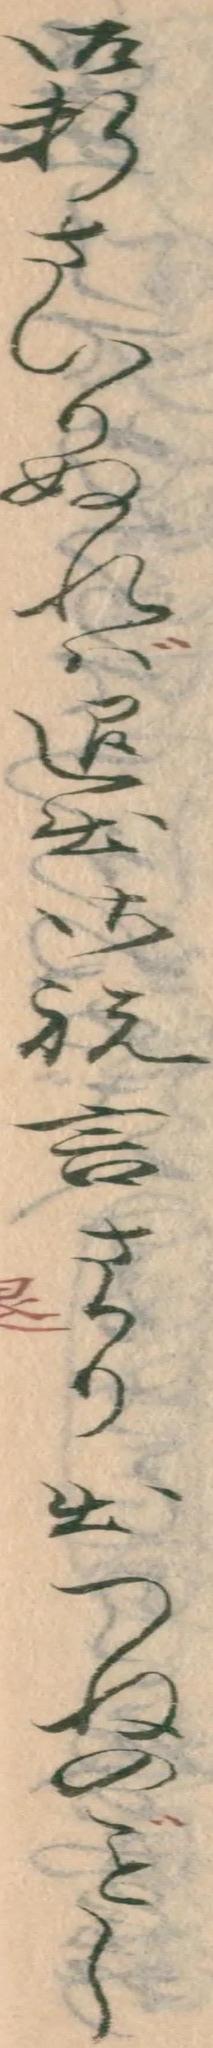御料まいりぬれば退出御祝言さかり出つねのごとし
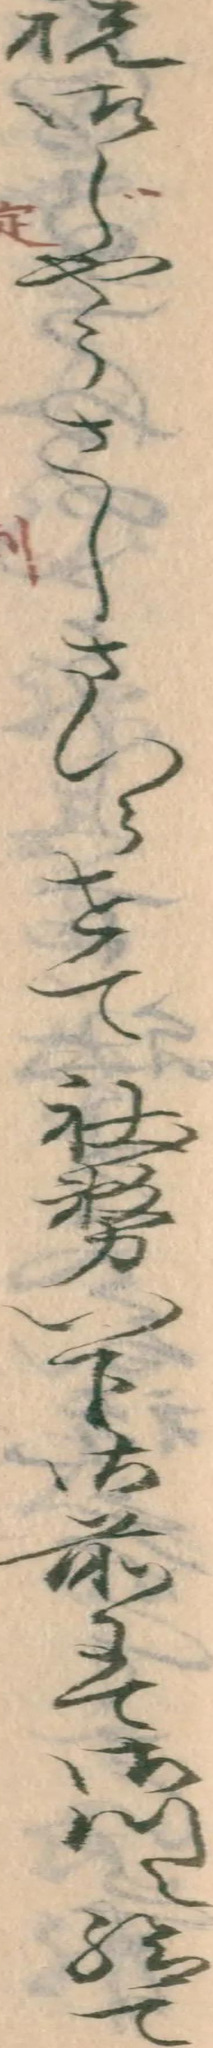祝御じやうさしまいらせて社務い下御前にて御つえ給て
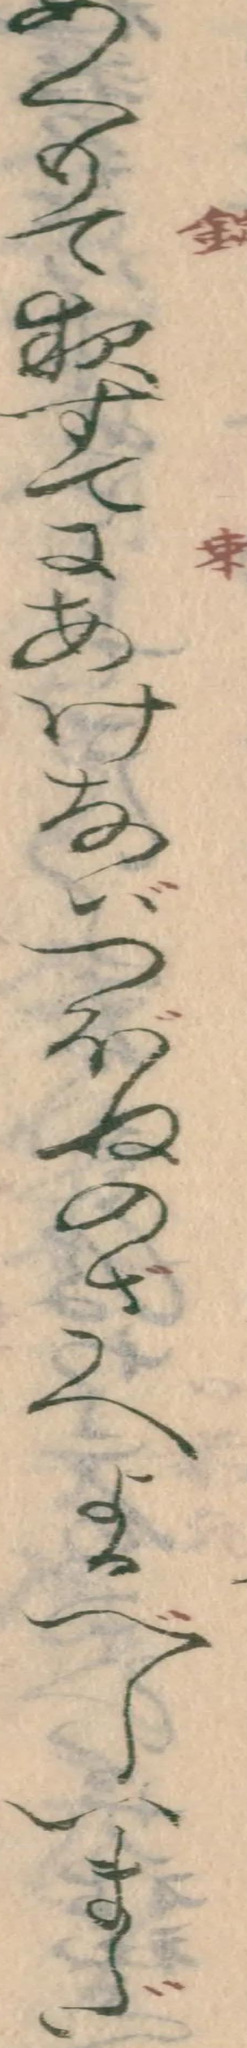めくりて夜すてにあけなばつぼねのざへよるべしいまだ
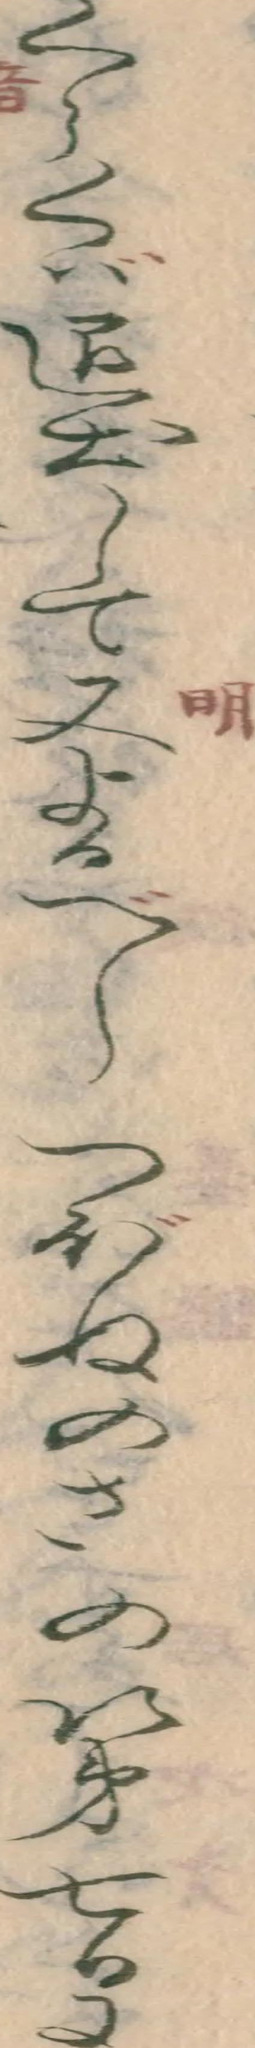くらくば退出して又よるべしつぼねのさの次第七日に
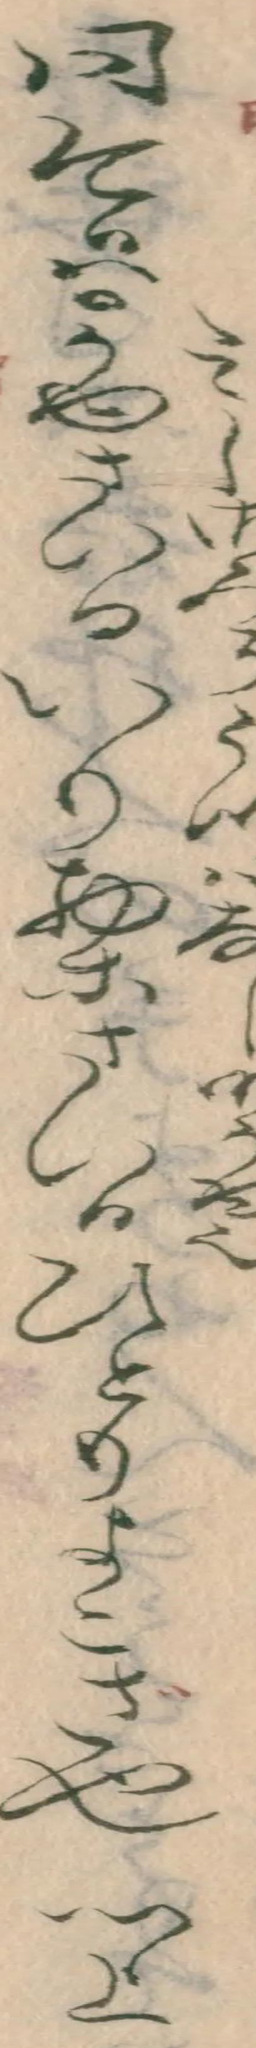同今日は◦かゆまいるいり物等まいるひとりよこざ也以上
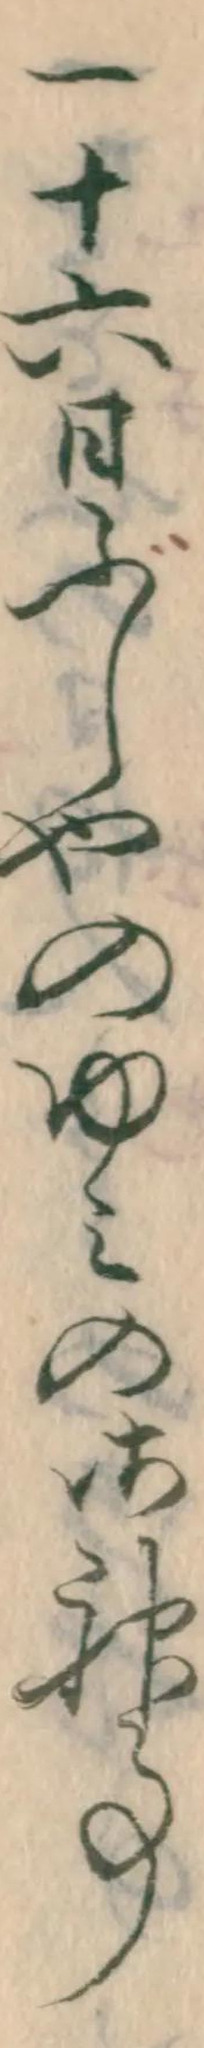一十六日ぶしやのゆみの御神事
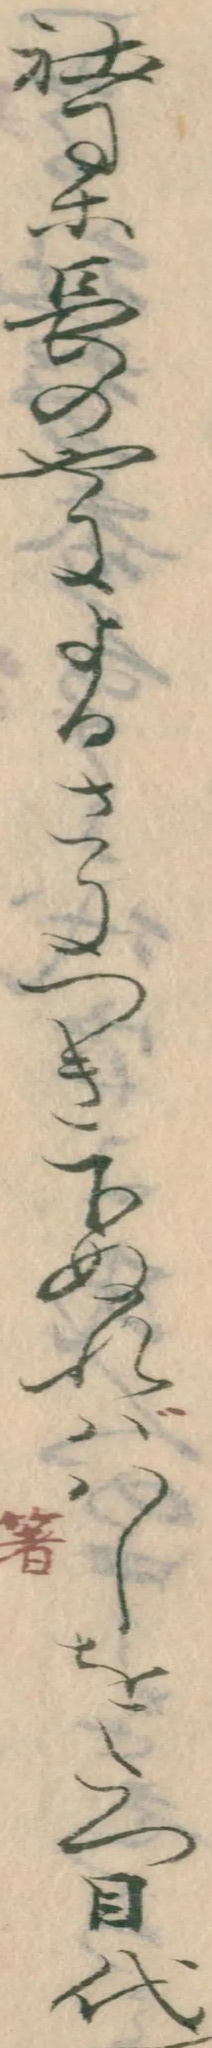社司等長のやによるさにつき下ぬればはしをたつ目代
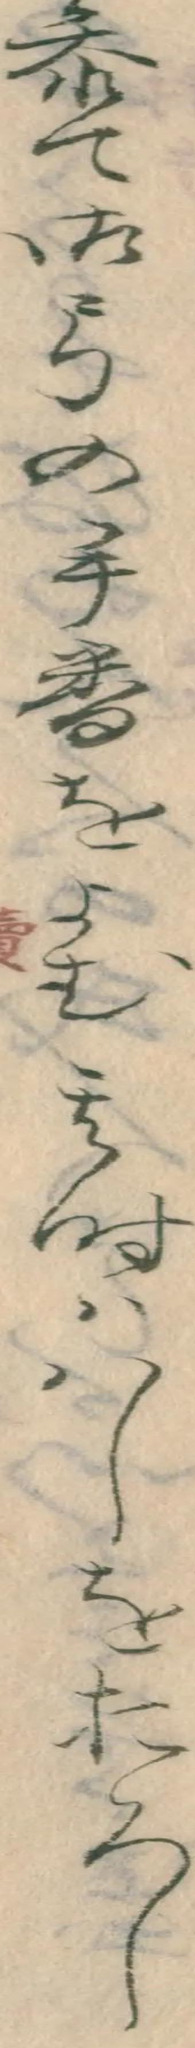参て御弓の手番をよむ其時ははしをおろし
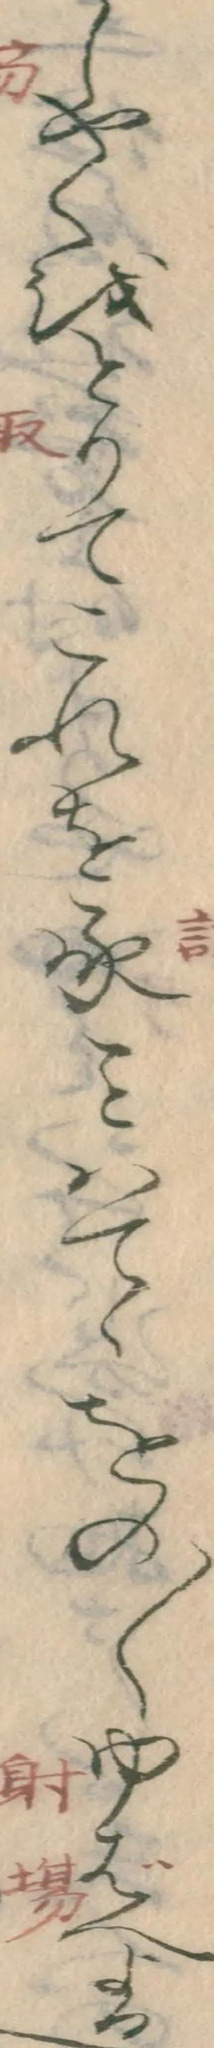しやくをとりてこれを承ことはてゝをの〳〵ゆばへよる
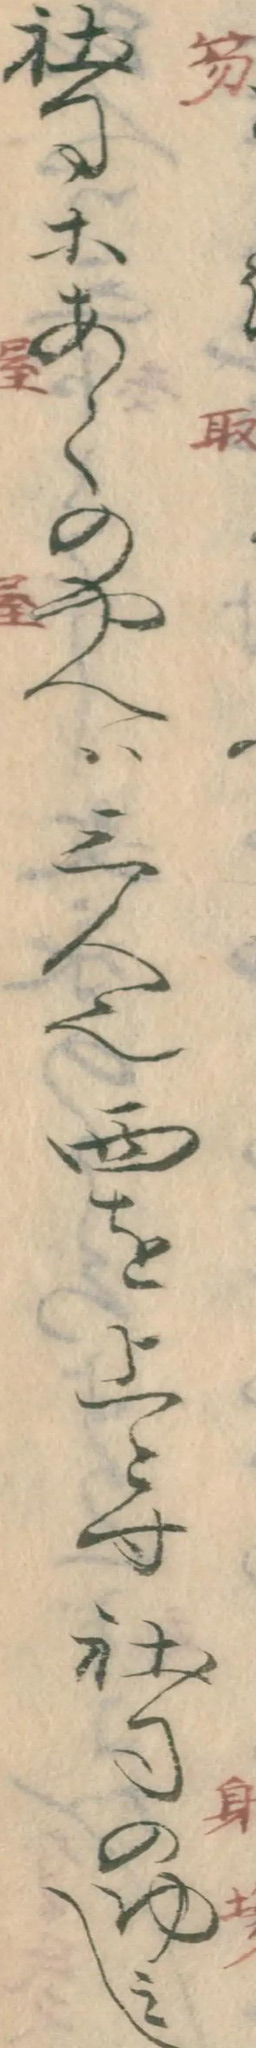社司等あくのやへは三人也西を上とす社司のゆみ

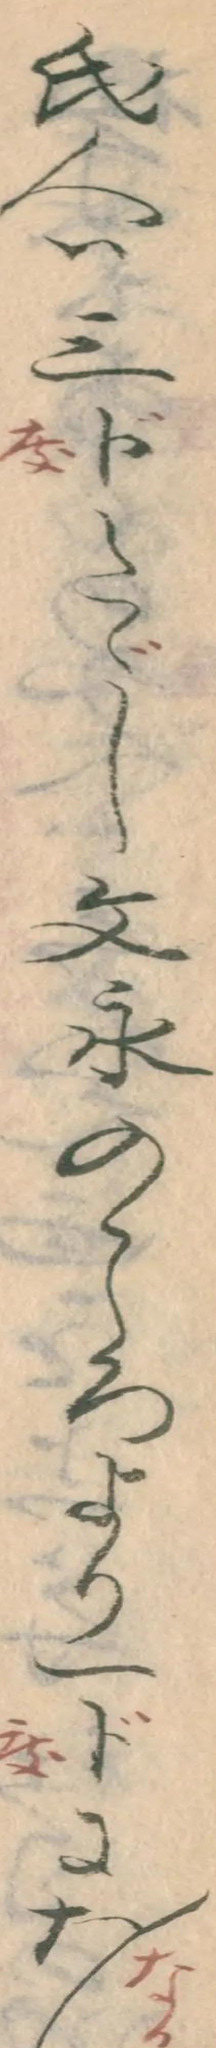氏人は三どたゞし文永のころより一どになる氏久歟
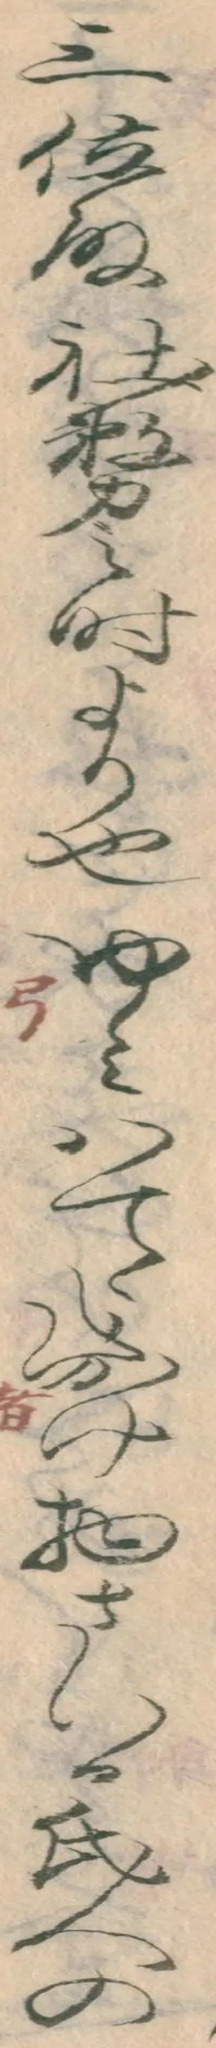三位殿社務之時より也ゆみはてゝかけ物まいる氏人の
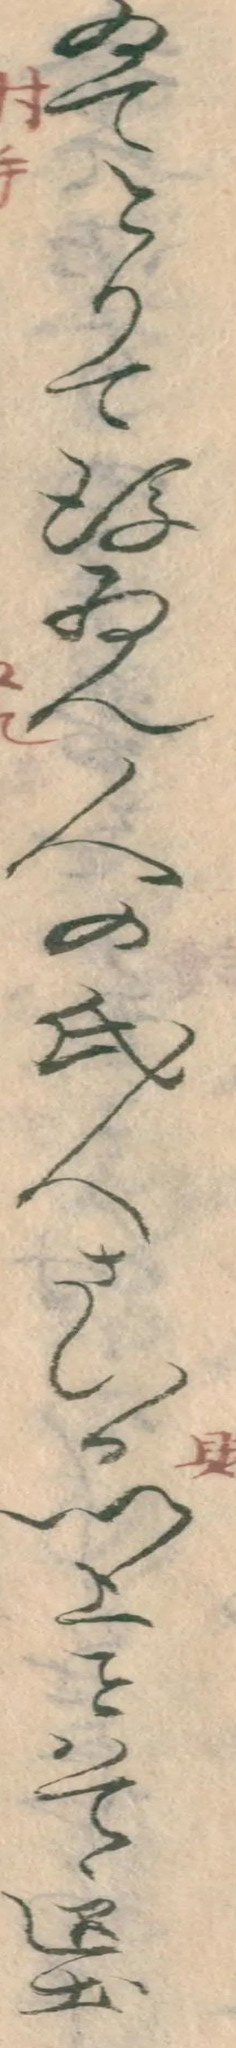ゐてとりて後ゐん人の氏人まいる以上ことはてゝ退出
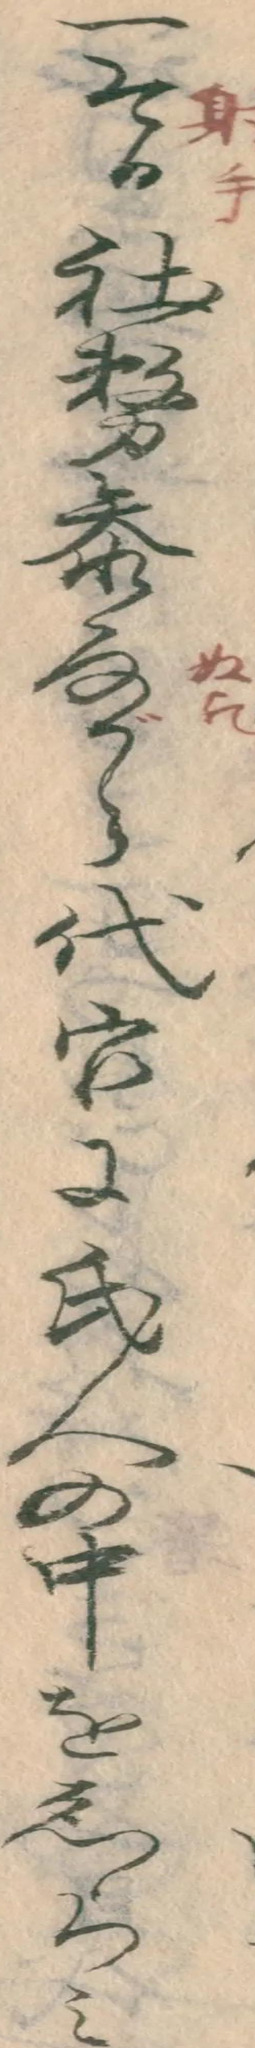一今日社務参ながら代官に氏人の中をゑらみ
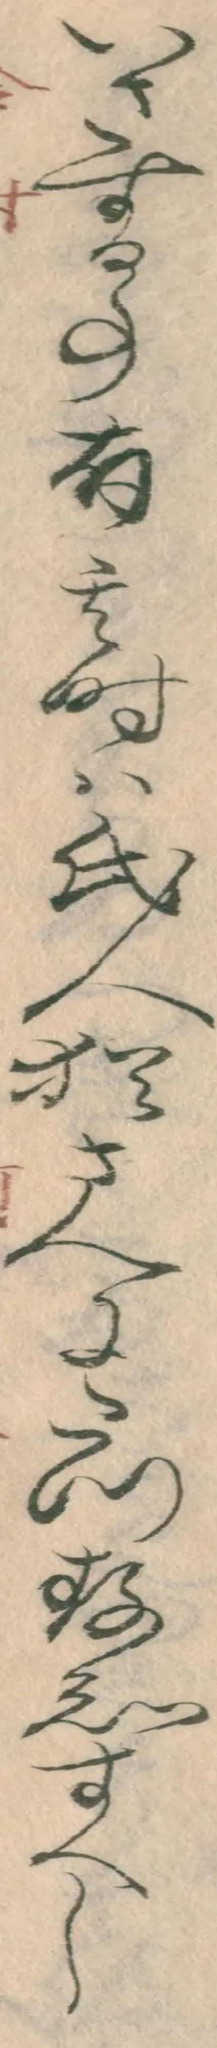いさする事有其時は氏人猶まへにたつ存知すへし
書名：賀茂社記録. 第3冊
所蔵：国立国会図書館 National Diet Library, JAPAN
